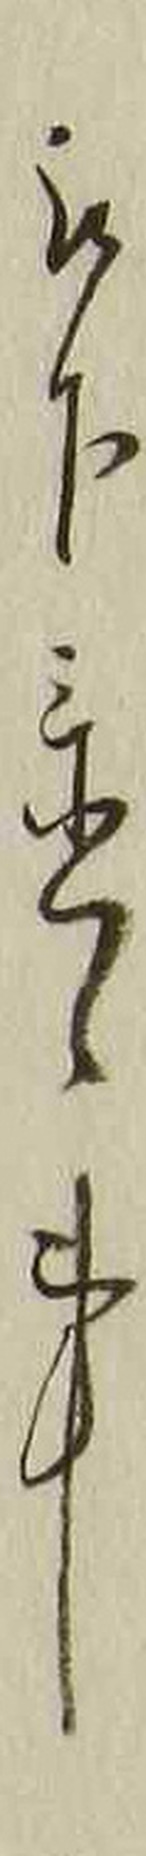被下置候事
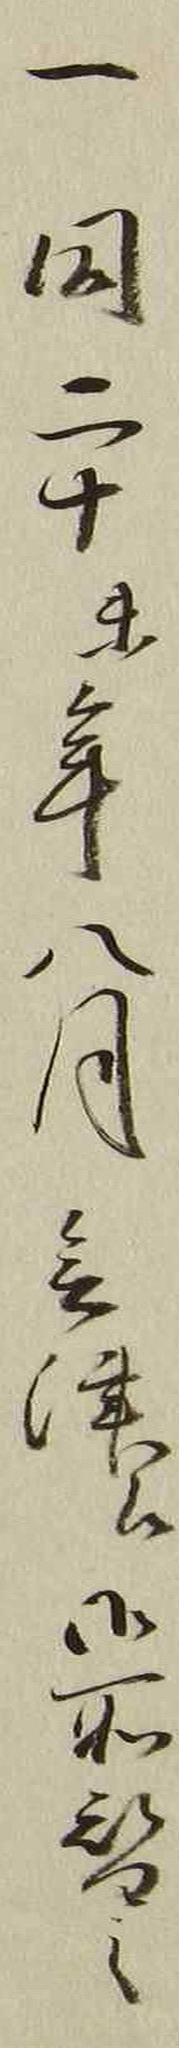一同二十未年八月会津江御所替之
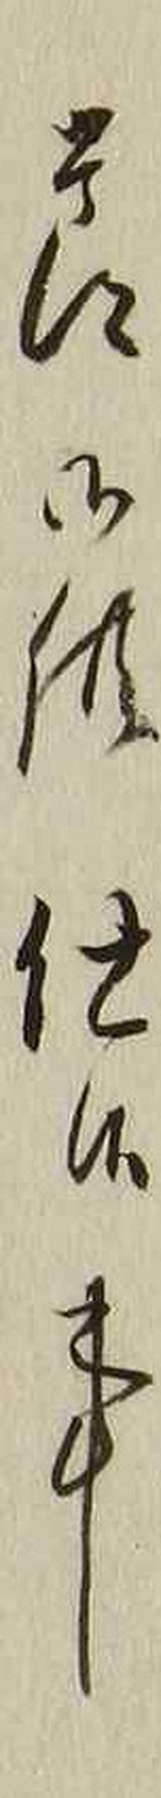節御供仕候事
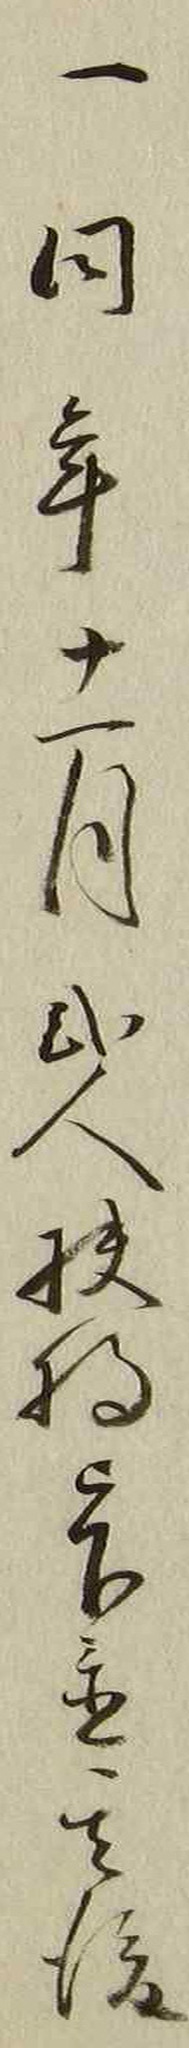一同年十一月弐人扶持被下置其後
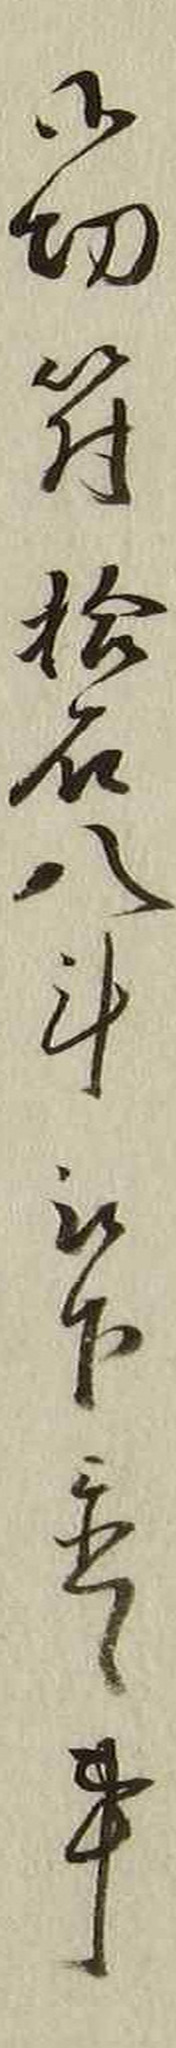御切符拾石八斗被下置候事
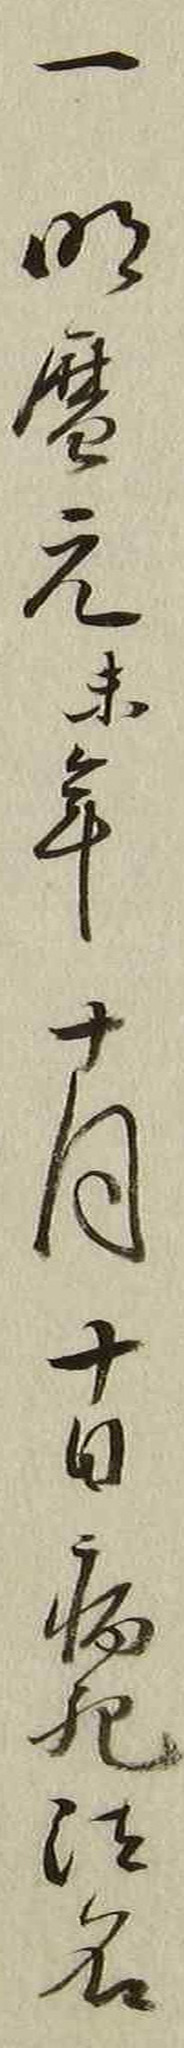一明暦元未年十月十日病死法名
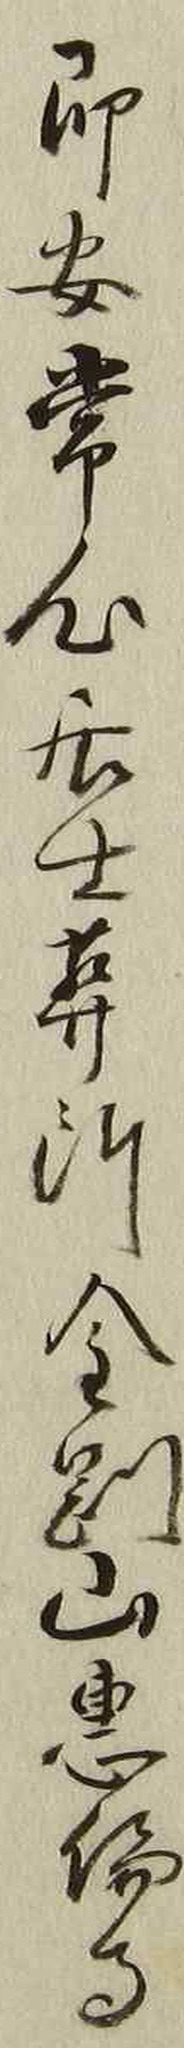即安常心居士葬所金剛山恵倫寺
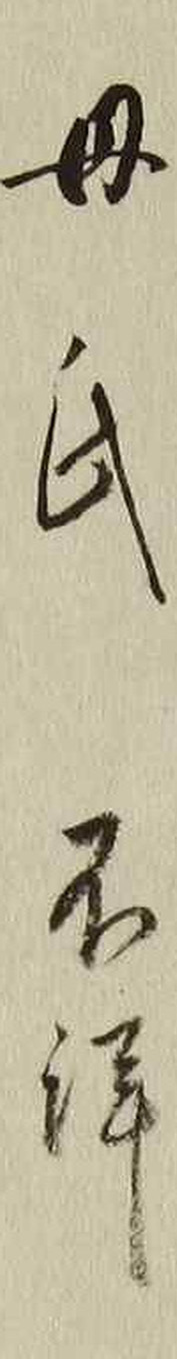母氏不詳
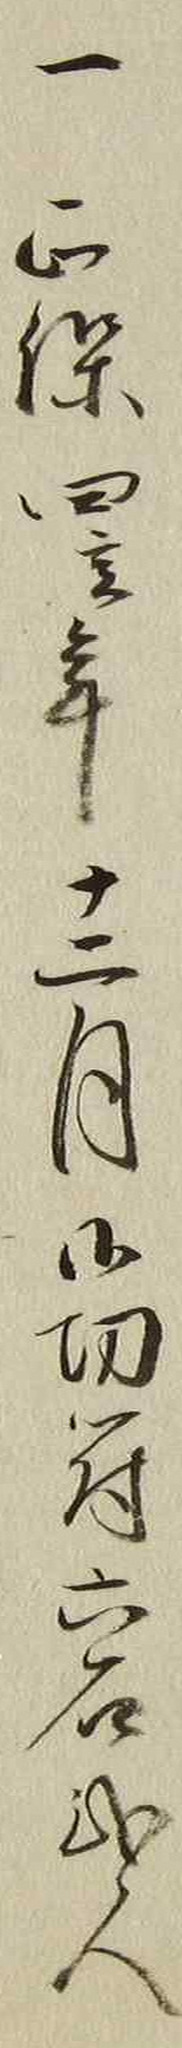一正保四亥年十二月御切符六石弐人
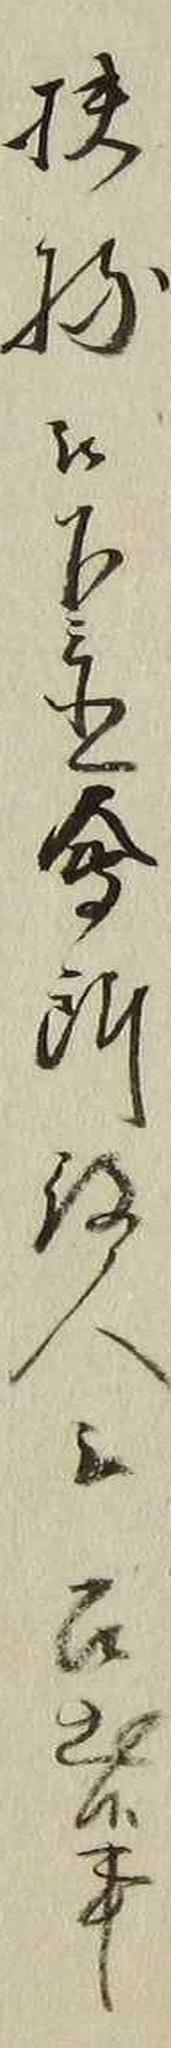扶持被下置会所役人被召出候事
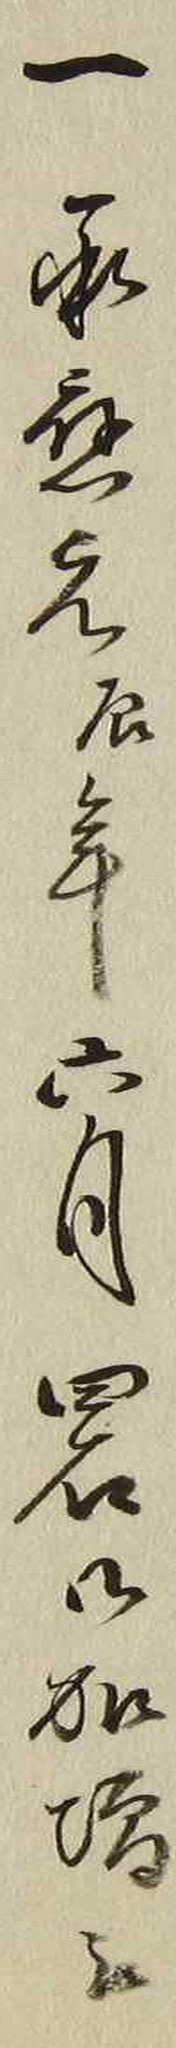一承応元辰年六月四石御加増被
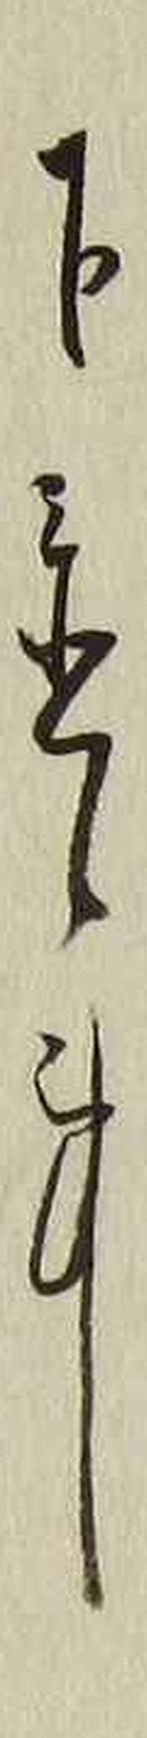下置候事
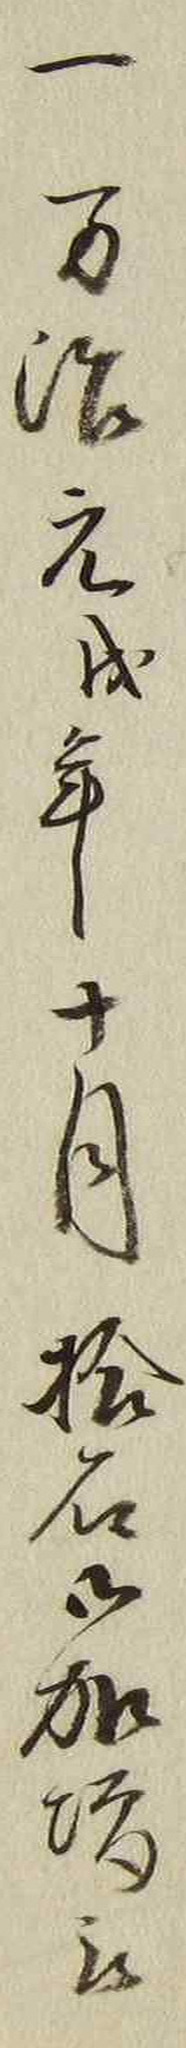一万治元戌年十月拾石御加増被
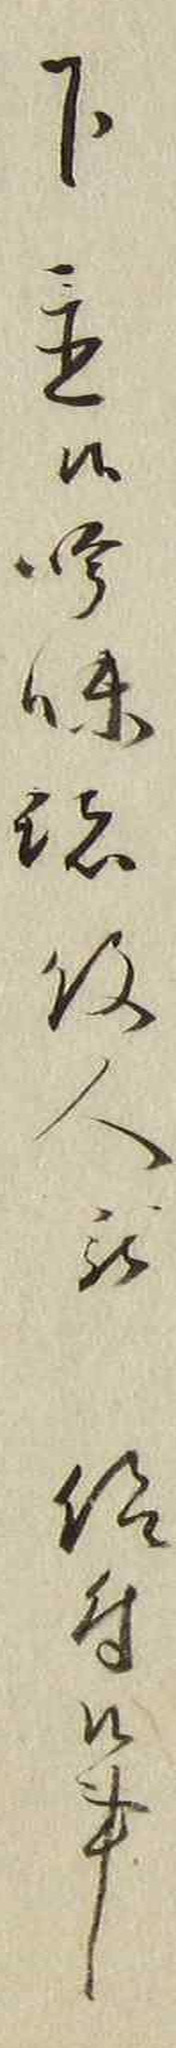下置侯吟味諸役人被仰付候事

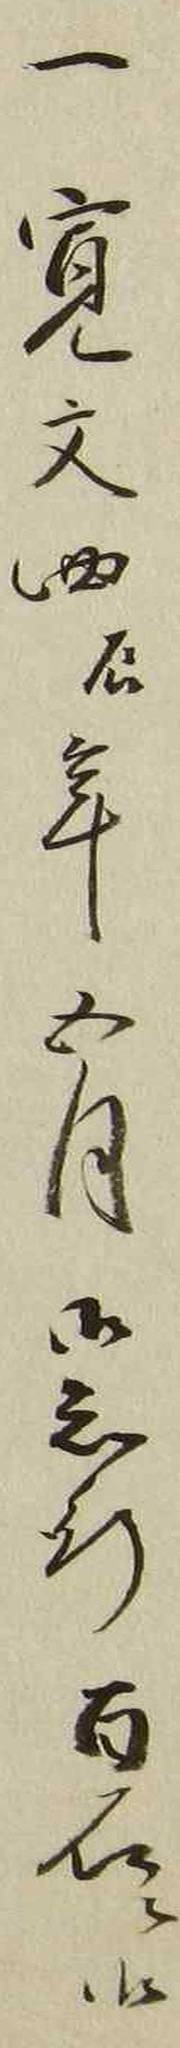一寛文四辰年五月御知行百石ニ御
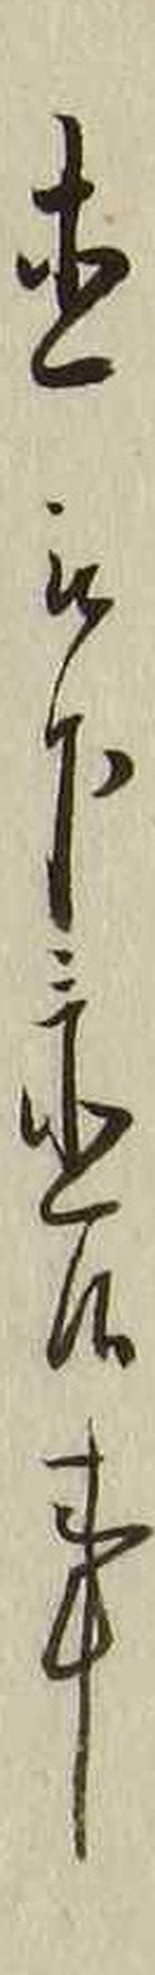直被下置候事
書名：諸士系譜　巻之32　い之部32
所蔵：会津若松市立会津図書館
